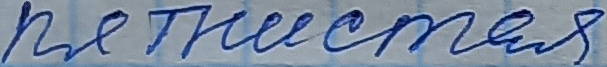пятнистая
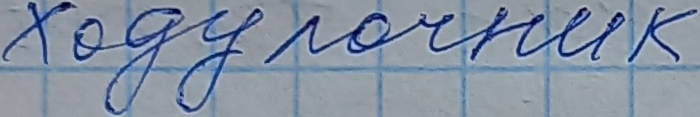ходулочник
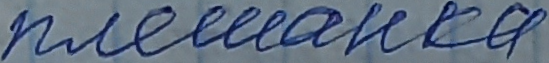плешанка
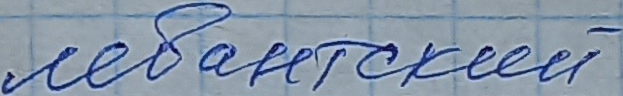левантский
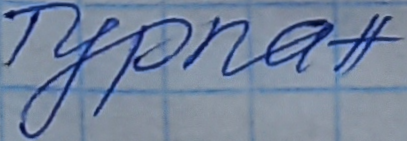турпан
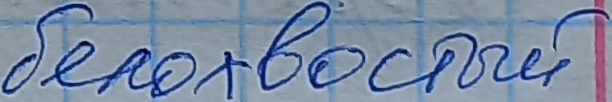белохвостый
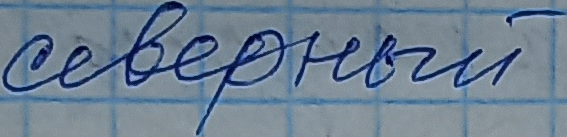северный
